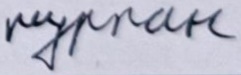турпан
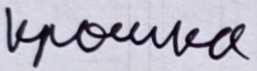крошка
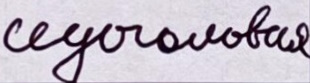седоголовая
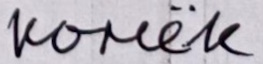конёк
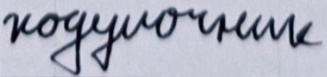ходулочник
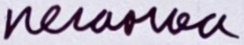пеганка
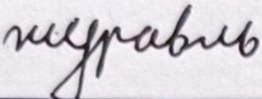журавль
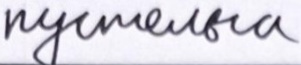пустельга
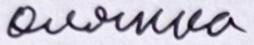оляпка
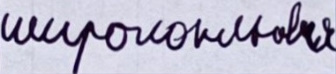ширококлювая
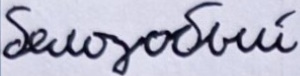белозобый
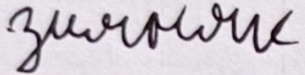зимняк
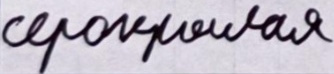серокрылая
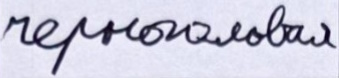черноголовая
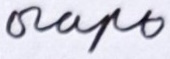огарь
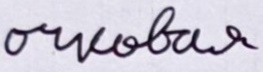очковая
